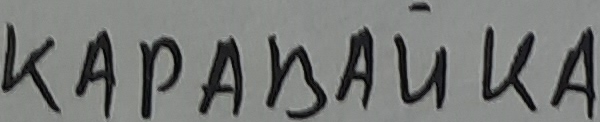каравайка
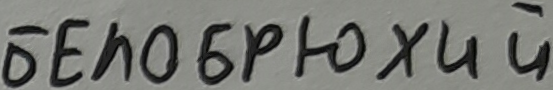белобрюхий
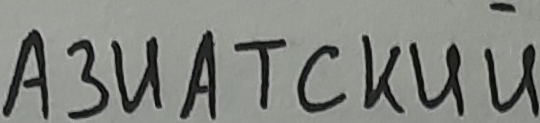азиатский
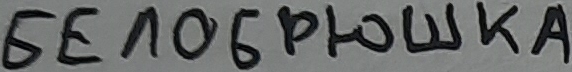белобрюшка
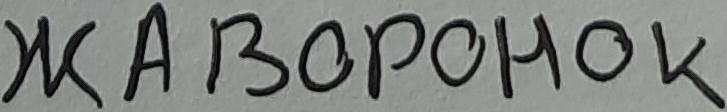жаворонок
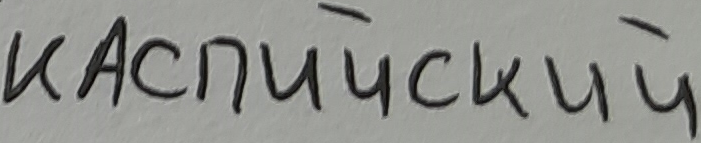каспийский
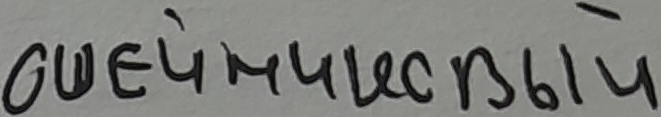ошейниковый
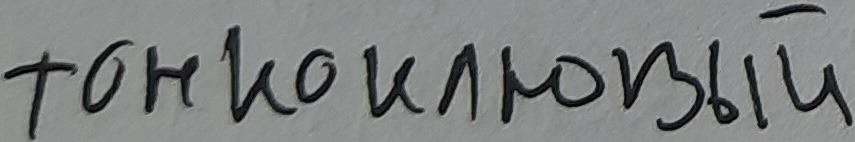тонкоклювый
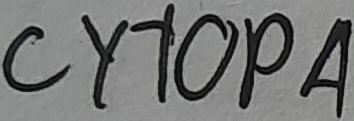сутора
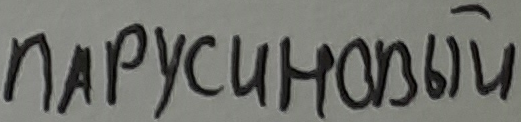парусиновый
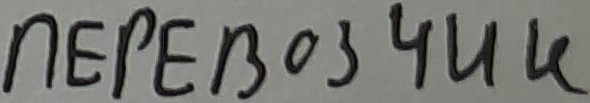перевозчик
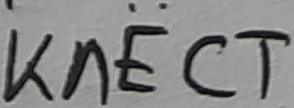клёст
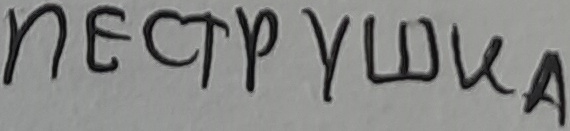пеструшка
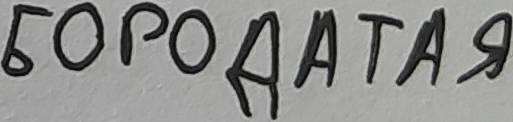бородатая
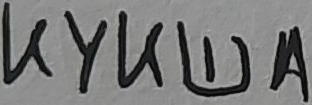кукша
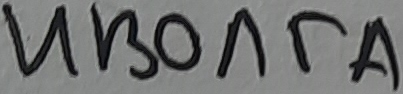иволга
